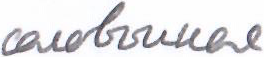соловьиная
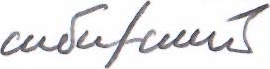сибирский
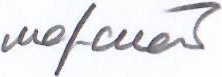морской
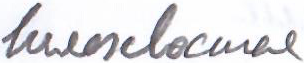вилохвостая
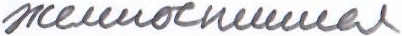желтоспинная
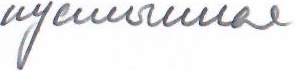пустынная
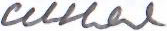синяя
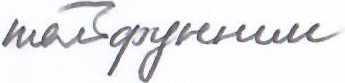тайфунник
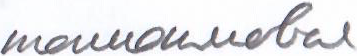тонкоклювая
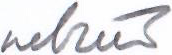певчий
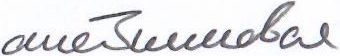ошейниковая
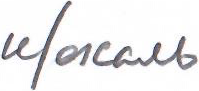крохаль
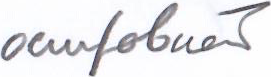островной
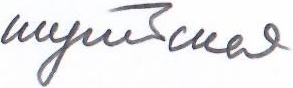индийская
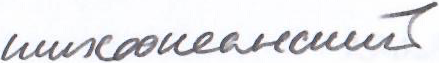тихоокеанский
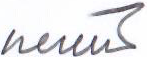пегий
